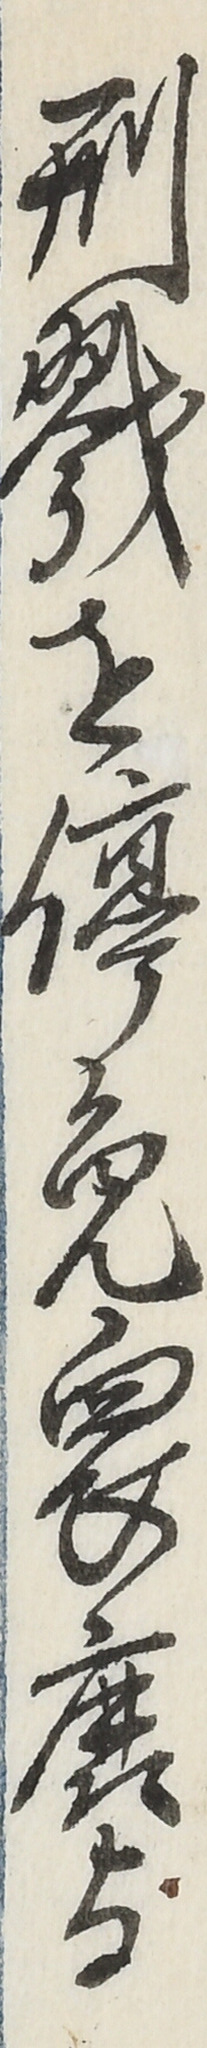刑戮を停免衆庶与
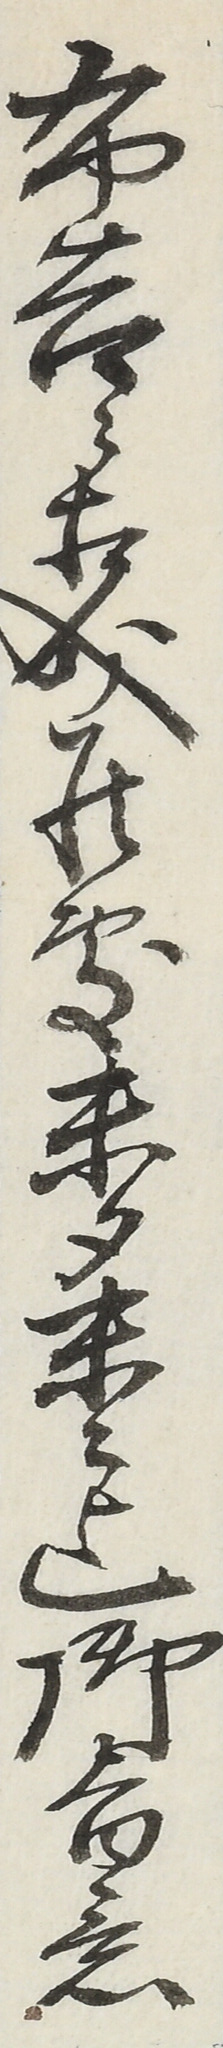布告ニ相成候処未タ末々迄御旨意
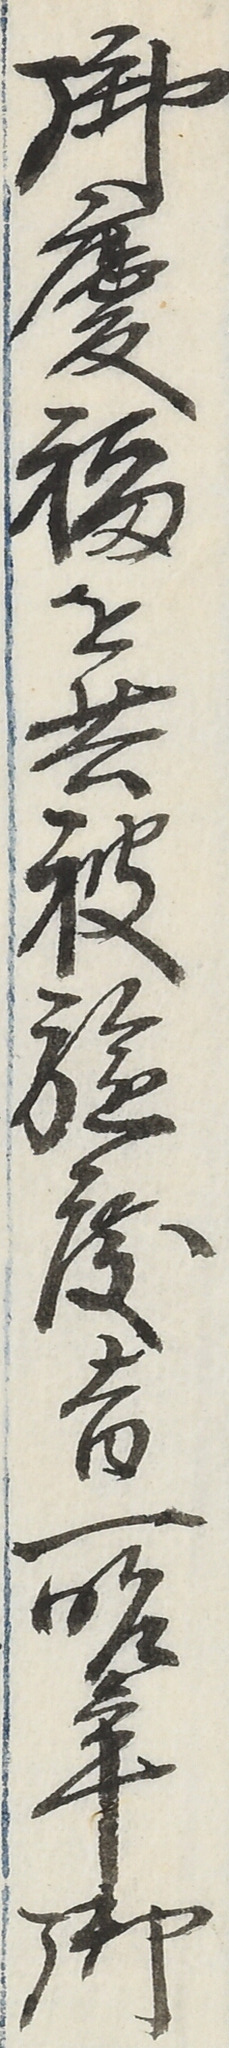御慶福を共被施度旨一昨年御
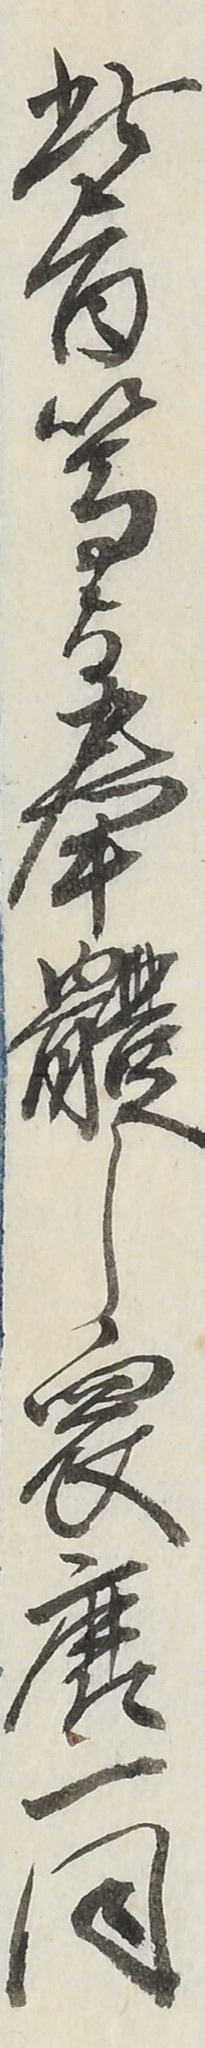此旨等与奉体し衆庶一同
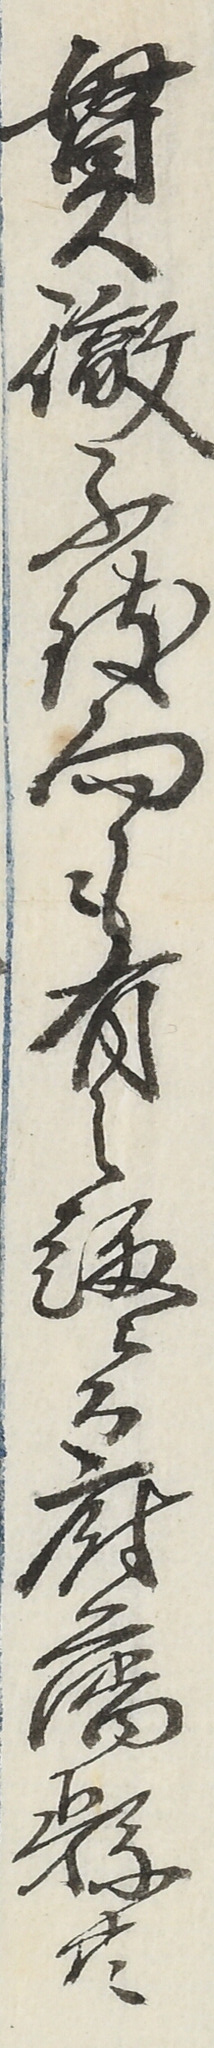貫徹不致向も有之趣ニ而府藩県共
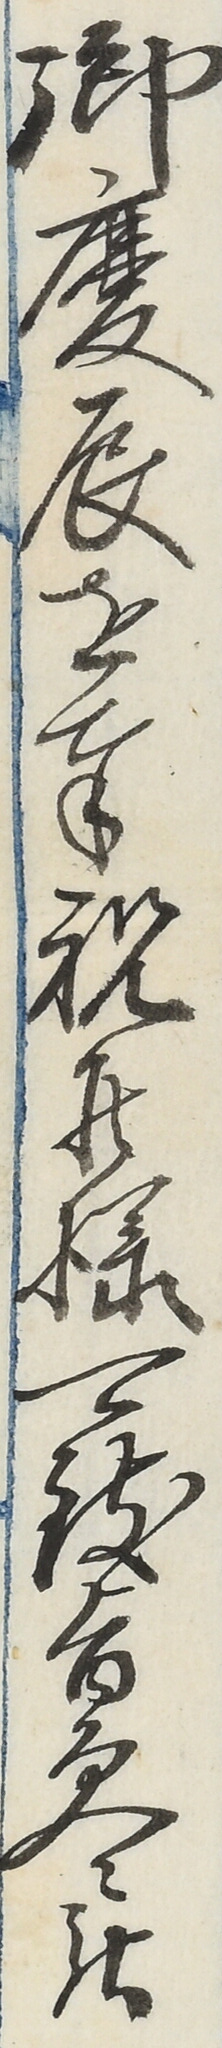御慶辰を奉祝候様可致旨更ニ候

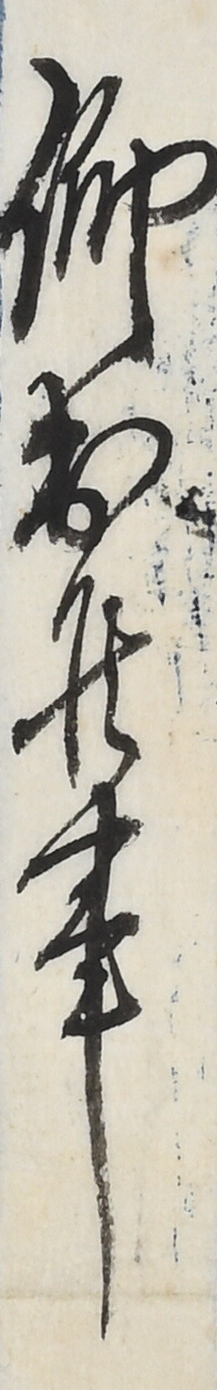仰出候事
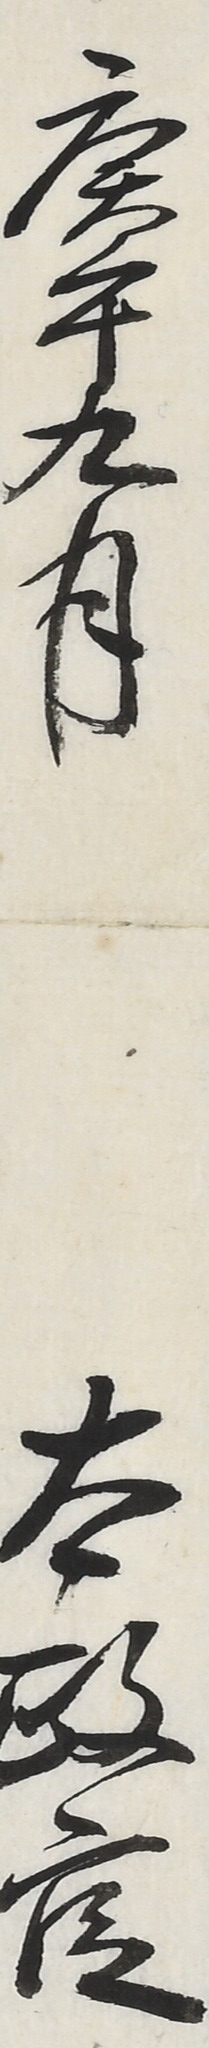庚午九月太政官
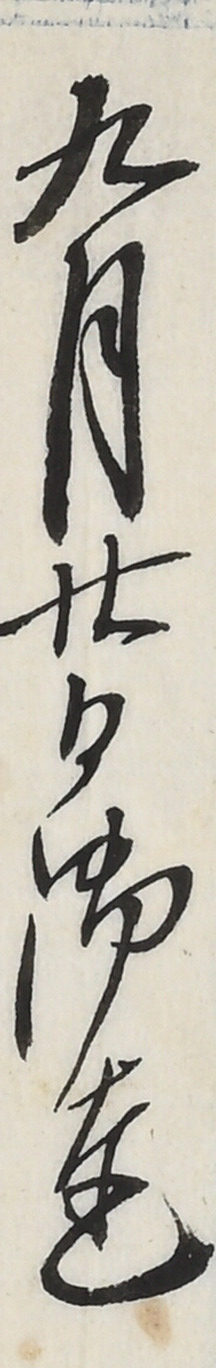九月廿日御達
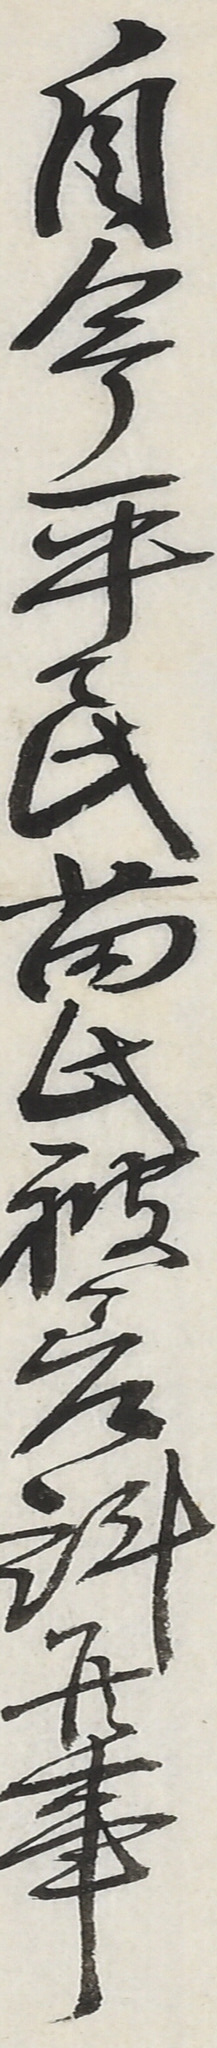自今平民苗氏被差許候事
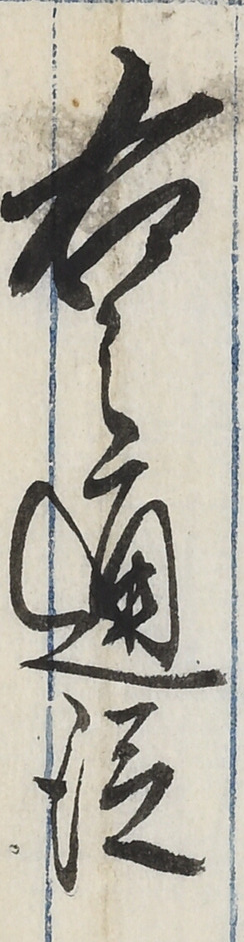右之通従
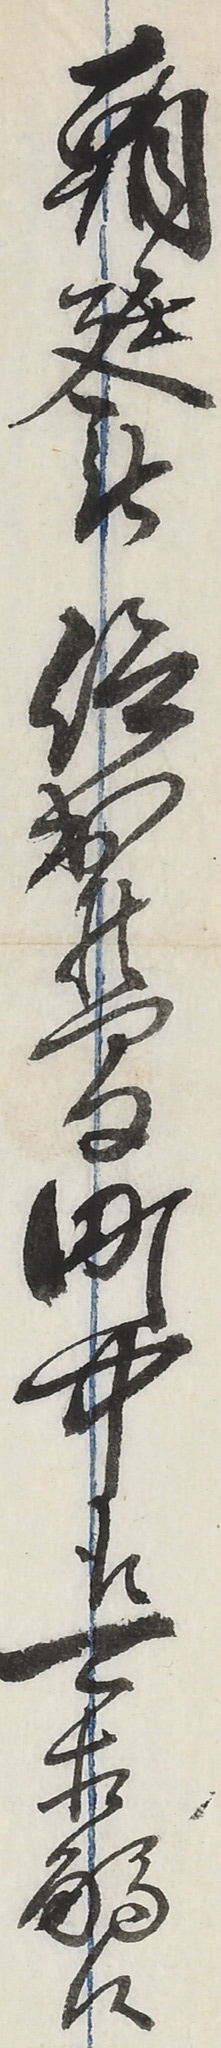朝廷被仰出候間町中江可相触候
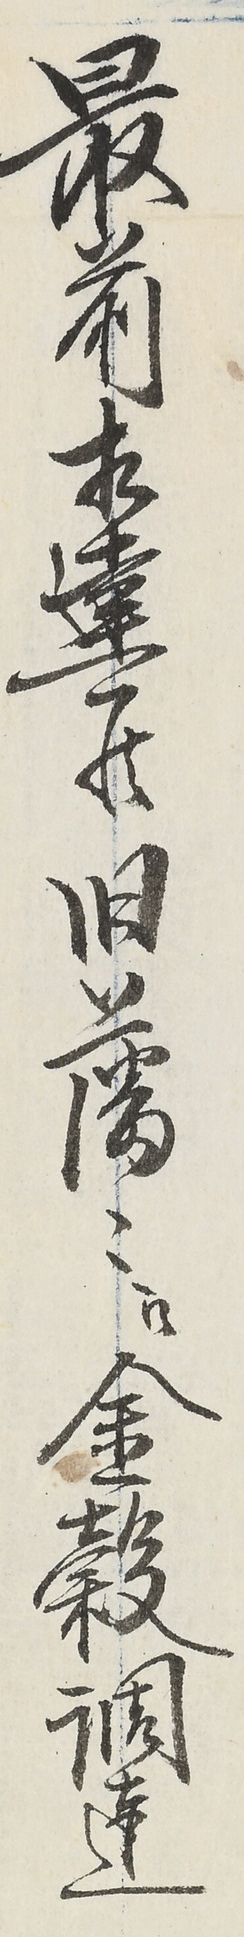最前相達候旧藩々江金穀調達
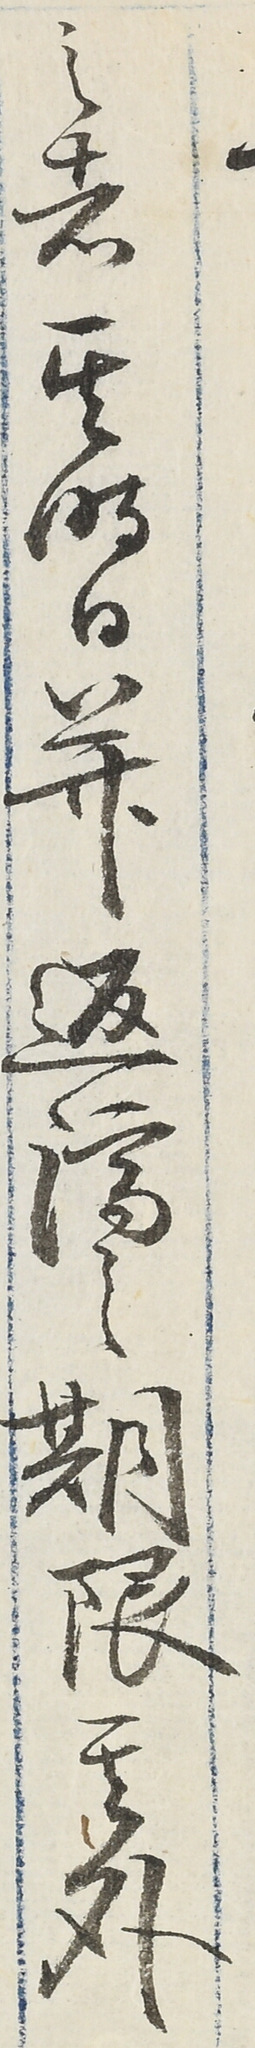之者其時日幷返済之期限其外
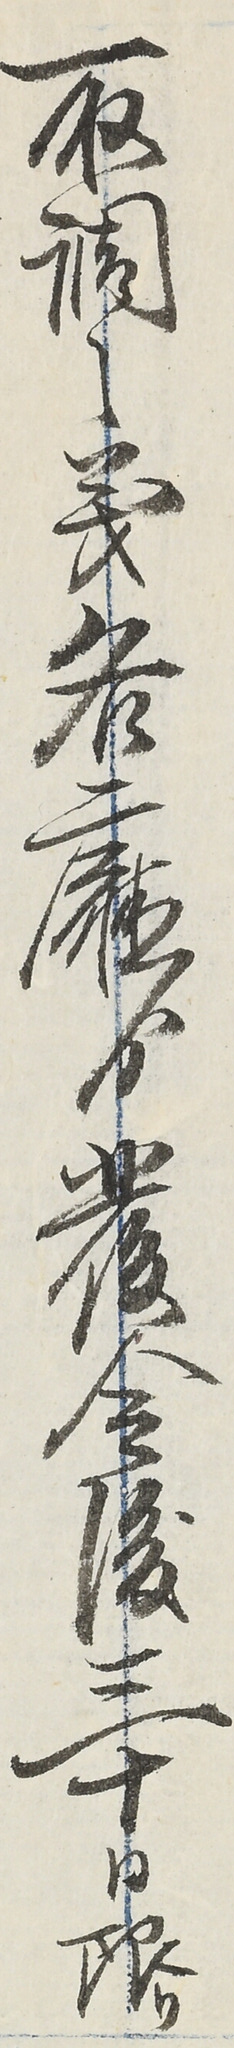取調之義各庁ゟ厳令後三十日限り
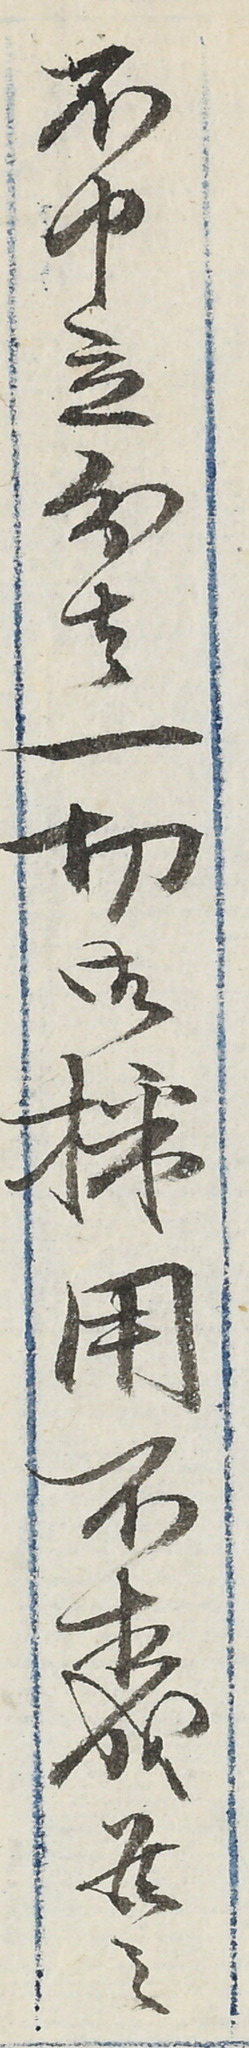不申立分者一切御採用不相成候之
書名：布達書留
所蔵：伊那市立高遠町図書館・合同会社AMANE
